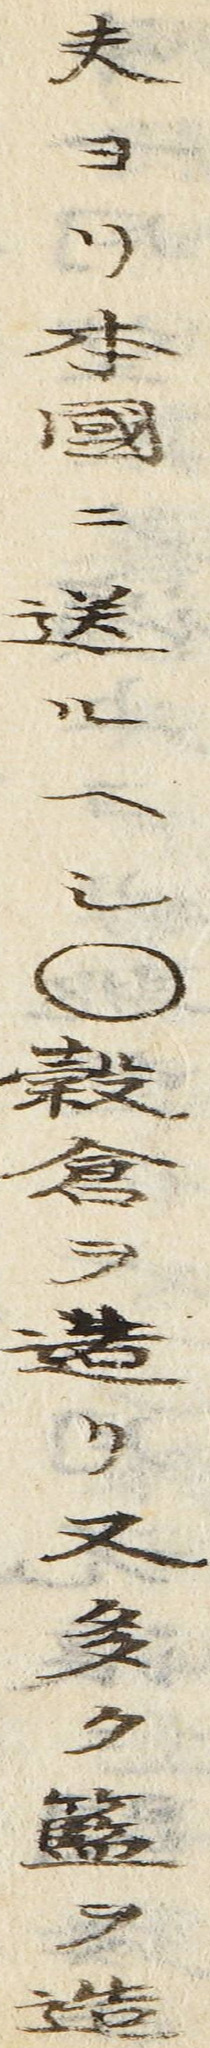夫ヨリ本国ニ送ルヘシ◯穀倉ヲ造リ又多ク籃ヲ造
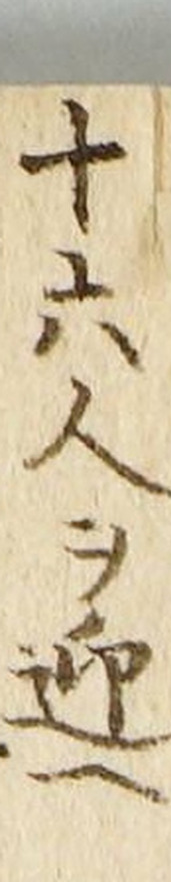十六人ヲ迎ヘ
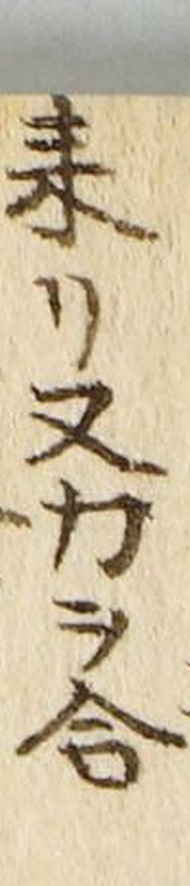来リ又力ヲ合
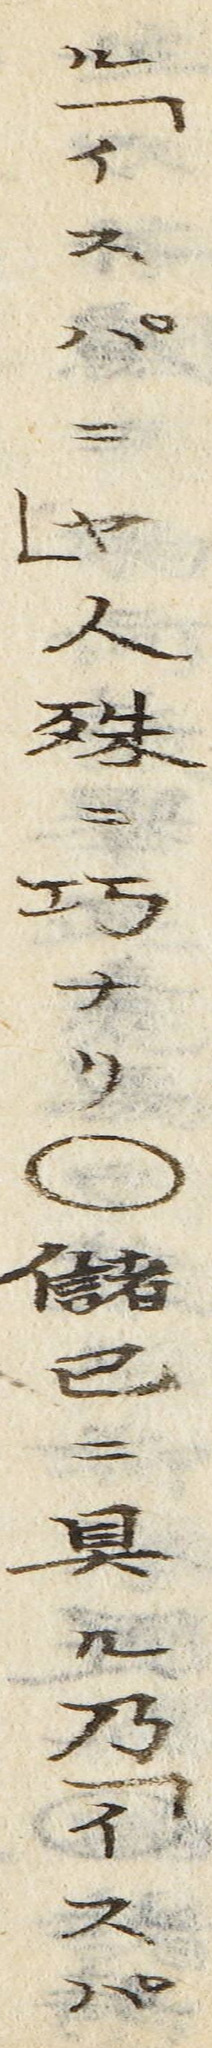ル「イスパニヤ」人殊ニ巧ナリ◯儲已ニ具ル乃「イスパ
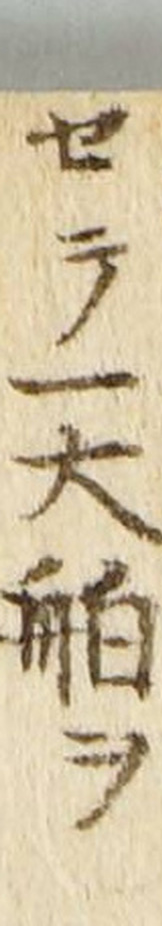セテ一大舶ヲ
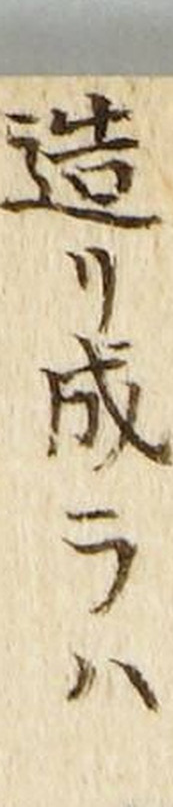造リ成ラハ
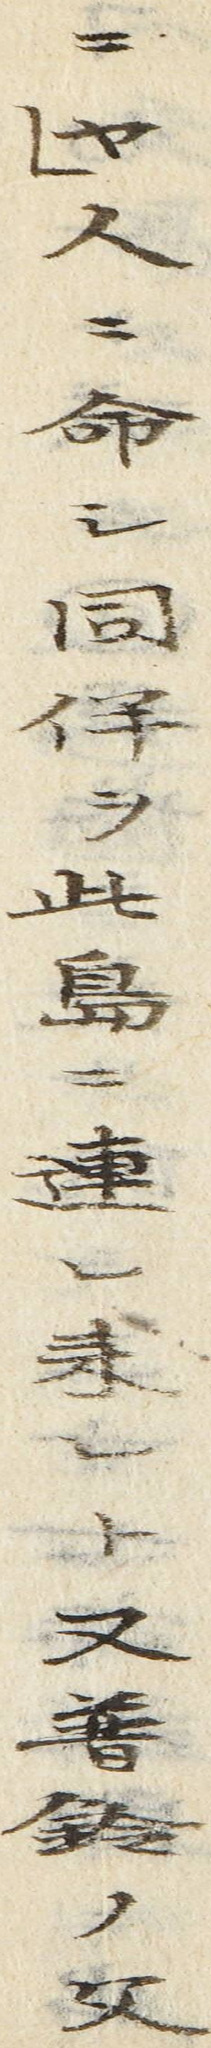ニヤ」人ニ命シ同伴ヲ此島ニ連レ来レト又普鈴ノ父
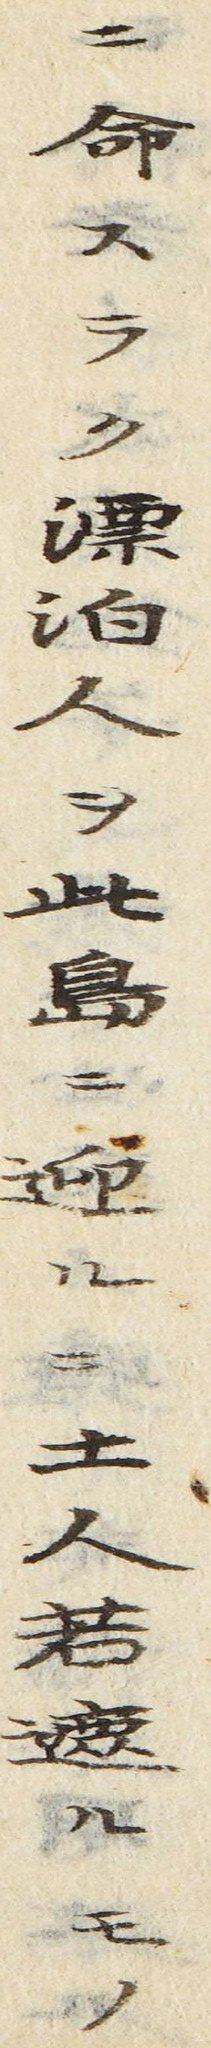ニ命スラク漂泊人ヲ此島ニ迎ルニ土人若遮ルモノ
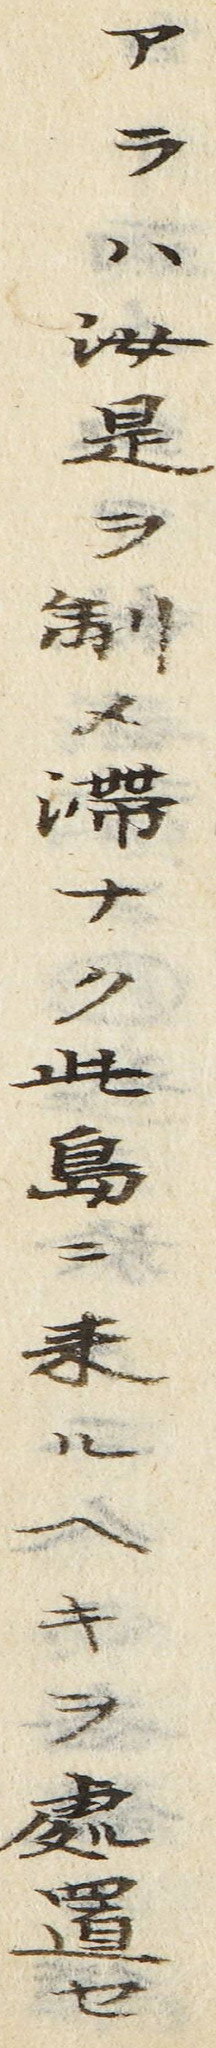アラハ汝是ヲ制シテ滞ナク此島ニ来ルヘキヲ処置セ

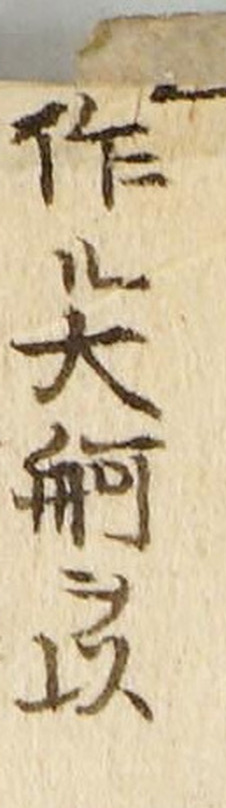作ル大舸ヲ以
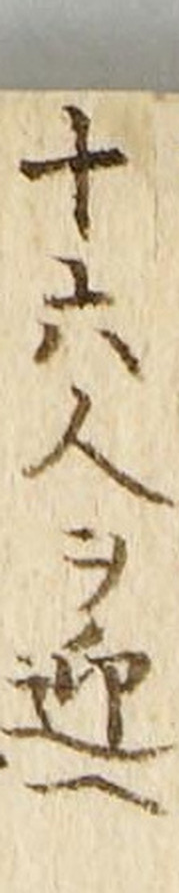十六人ヲ迎ヘ
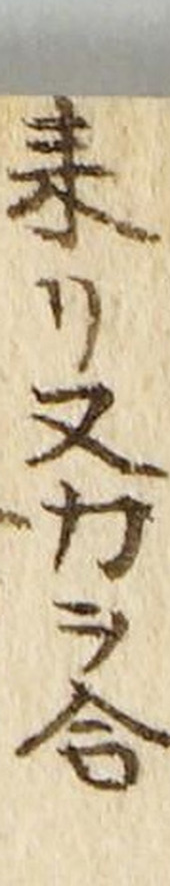来リ又力ヲ合
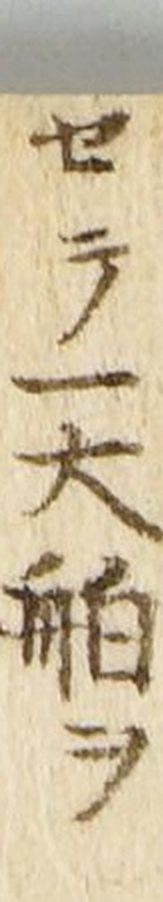セテ一大舶ヲ
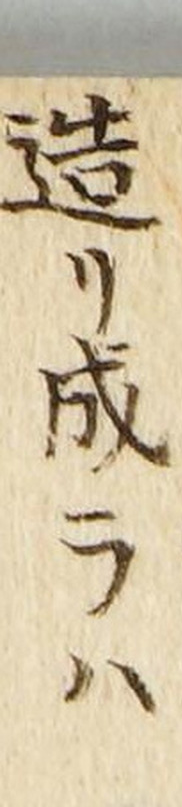造リ成ラハ

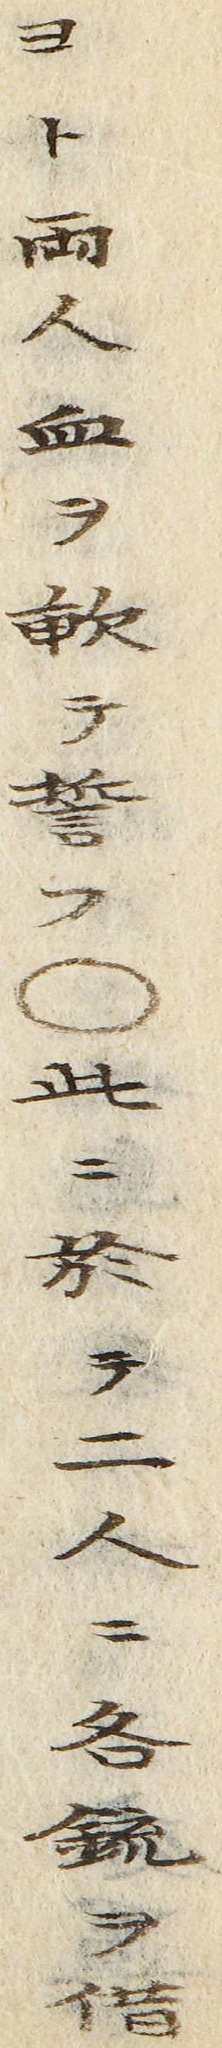ヨト両人血ヲ歃テ誓フ◯此ニ於テ二人ニ各銃ヲ借
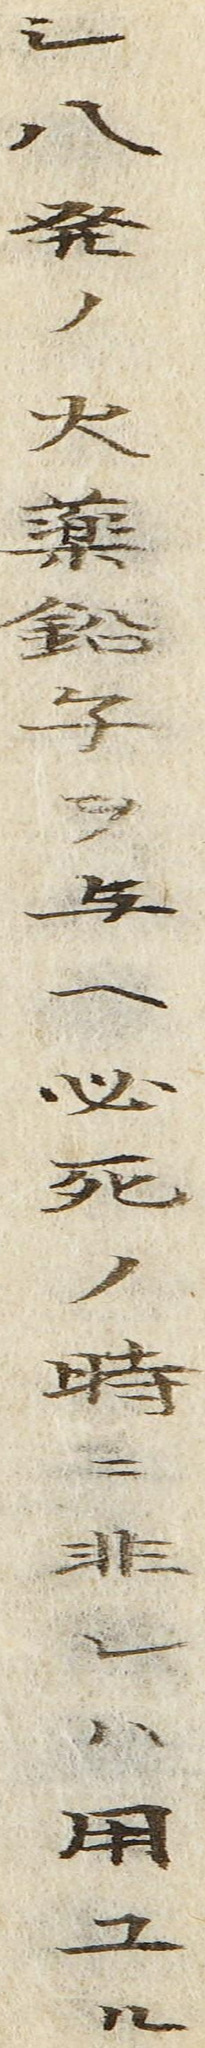シ八発ノ火薬鉛子ヲ与ヘ必死ノ時ニ非レハ用ユル
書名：漂流紀事
